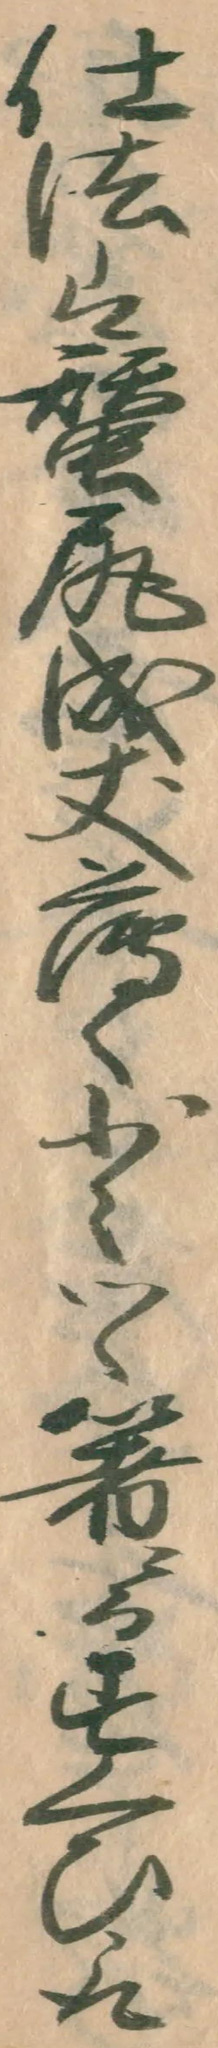仕法は蚕尻成丈薄く少しつゝ箸にてすくひ取

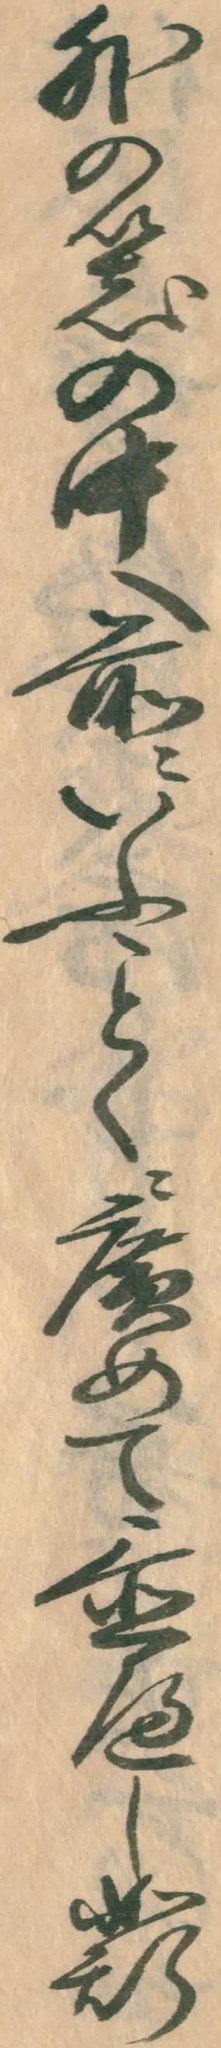外の器の中へ前にいふことくに広めて置へし如斯
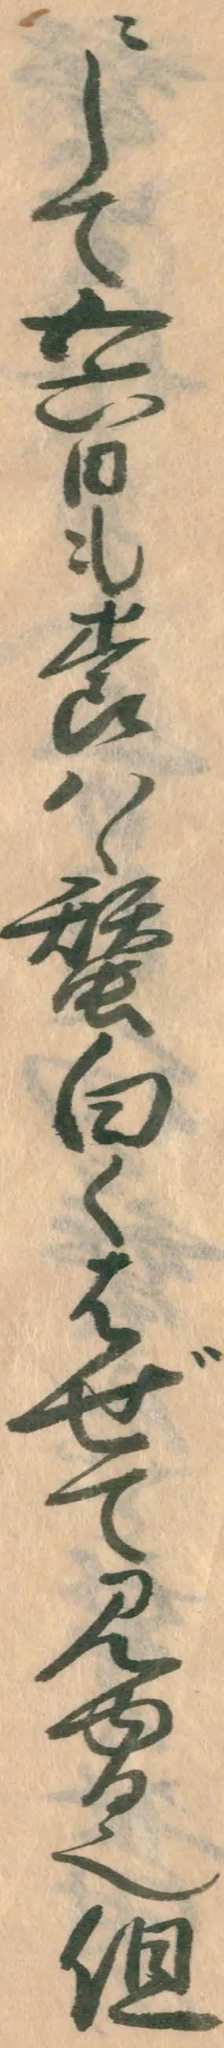にして五六日も養はゝ蚕白くはぜて見ゆる也但
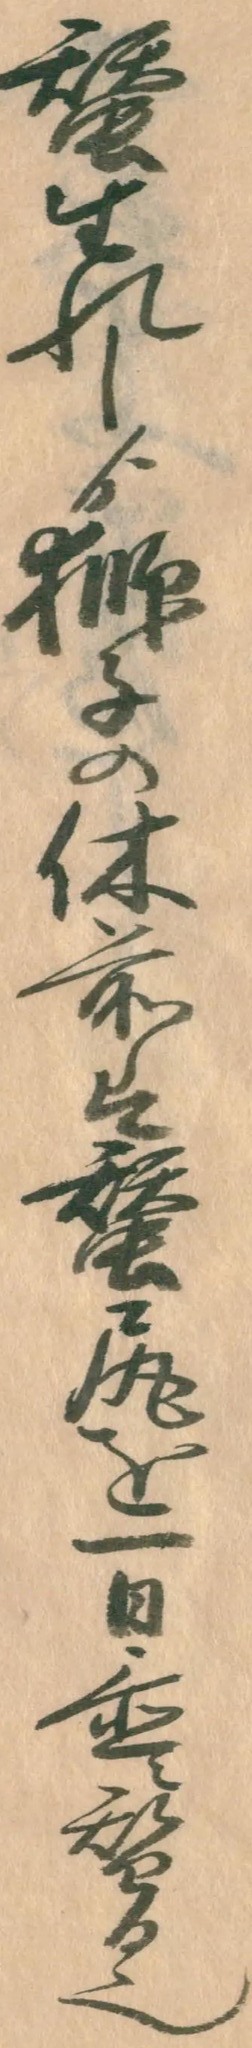蚕生れしゟ獅子の休前は蚕尻を一日置に替る也
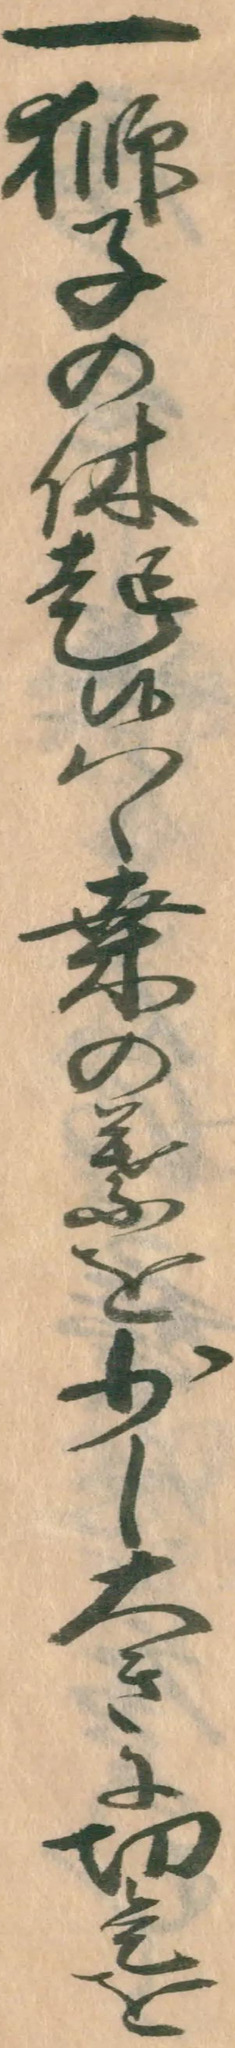一獅子の休起候はゝ桑の葉を少し大きに切是を
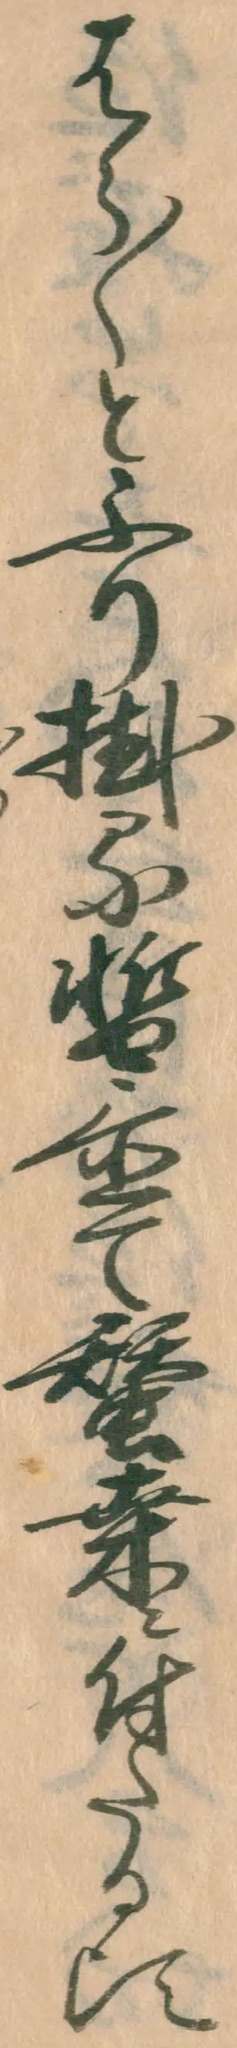はら〳〵とふり掛る暫置て蚕桑に付たる頃
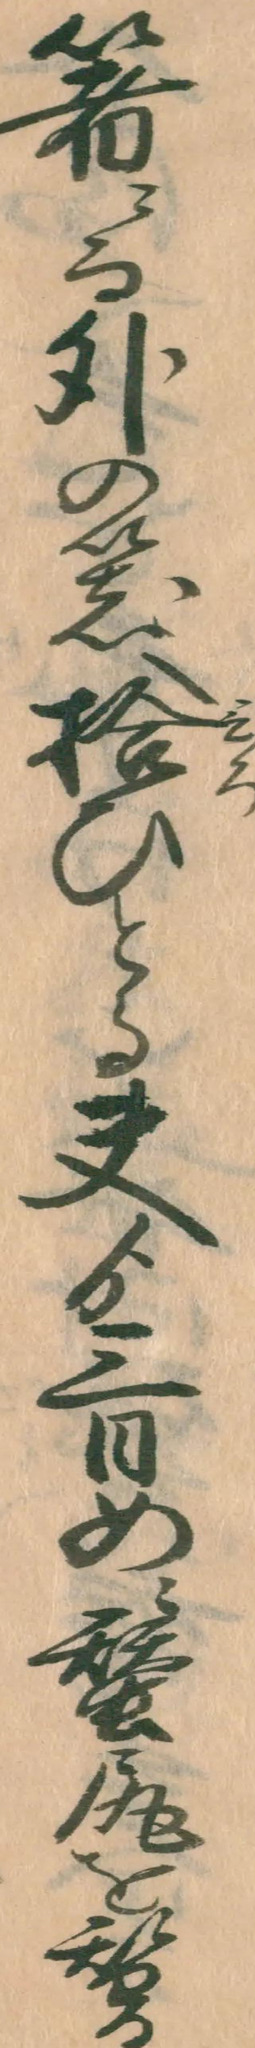箸にて外の器へ拾ひとる夫ゟ三日めに蚕尻を替る
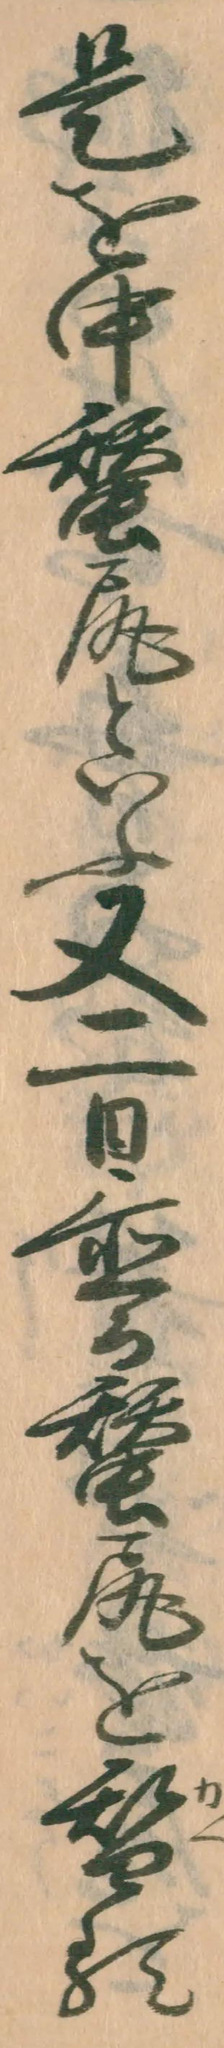是を中蚕尻といふ又二日置て蚕尻を替る
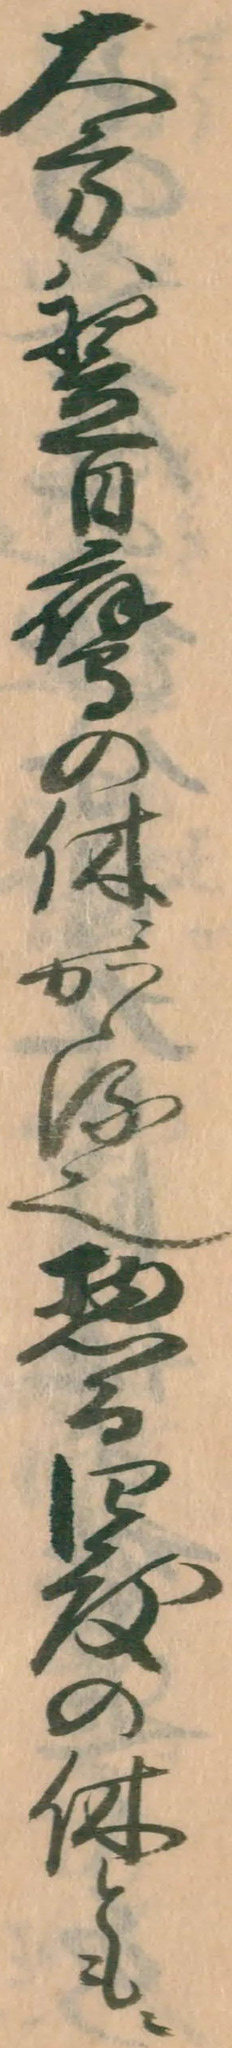大方は翌日鷹の休にかゝる也惣て四度の休とも、
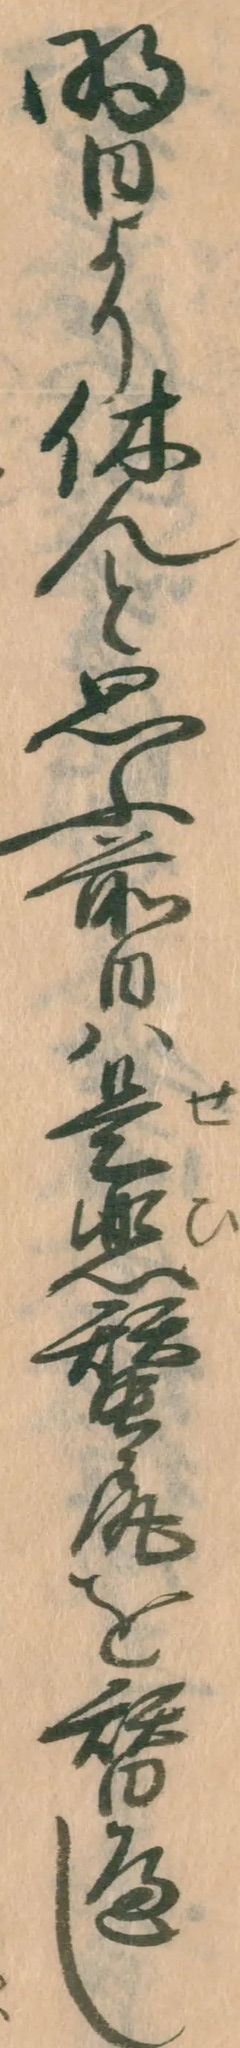明日より休んと思ふ前日は是悲蚕尾を替へし
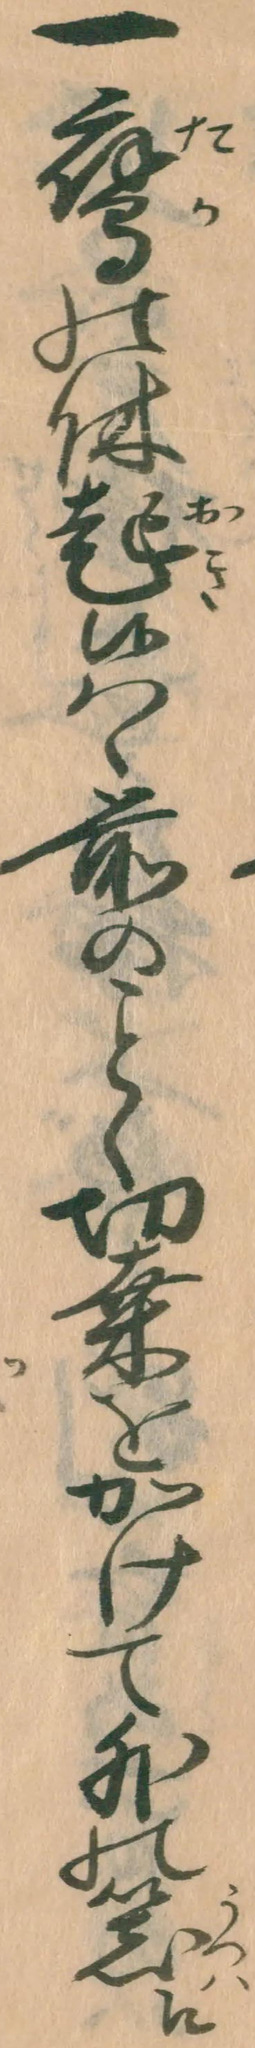一鷹の休起候はゝ前のことく切桑をかけて外の器え
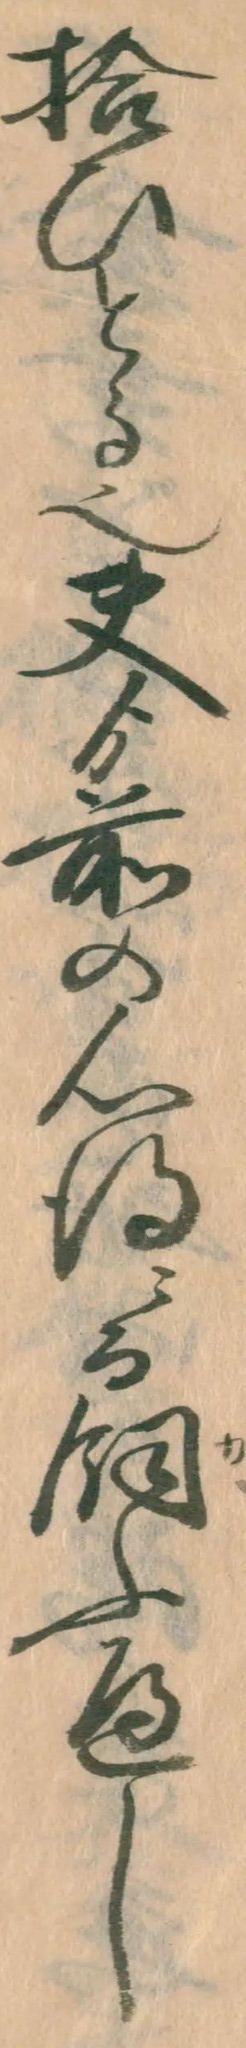拾ひとる也夫ゟ前の心得にて飼ふへし
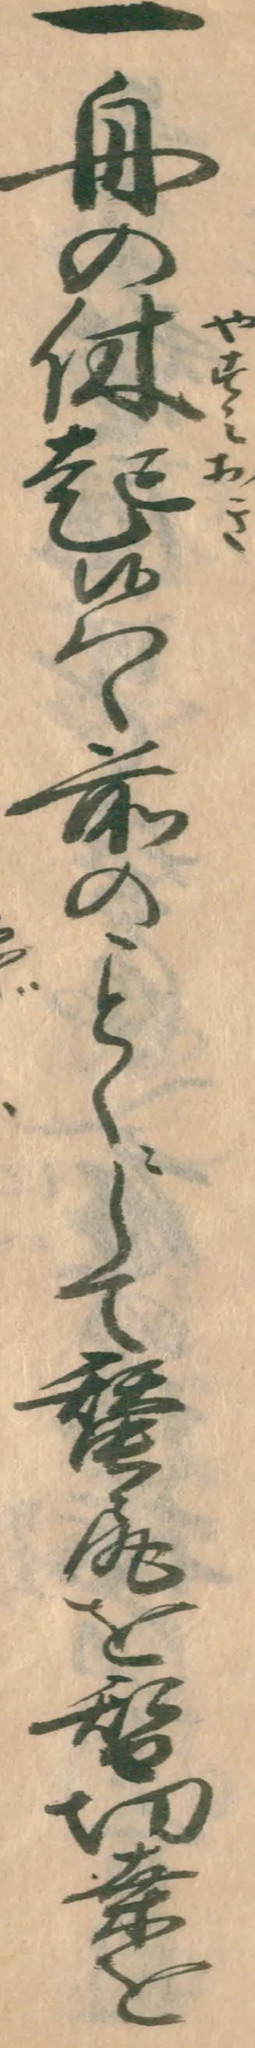一舟の休起候はゝ前のことくにして蚕尻を替切桑を
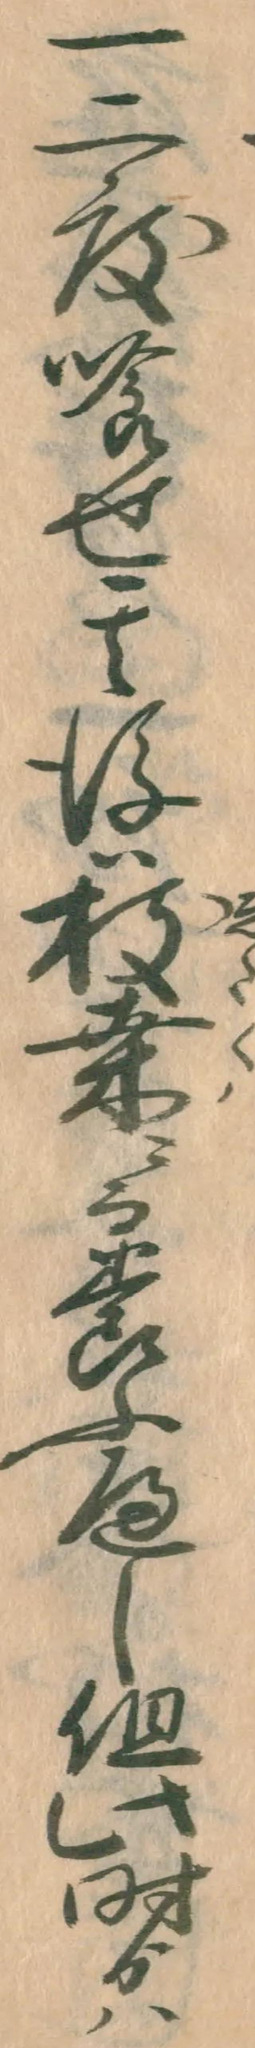一二度喰せ其後枝桑にて養ふへし但此時ゟは
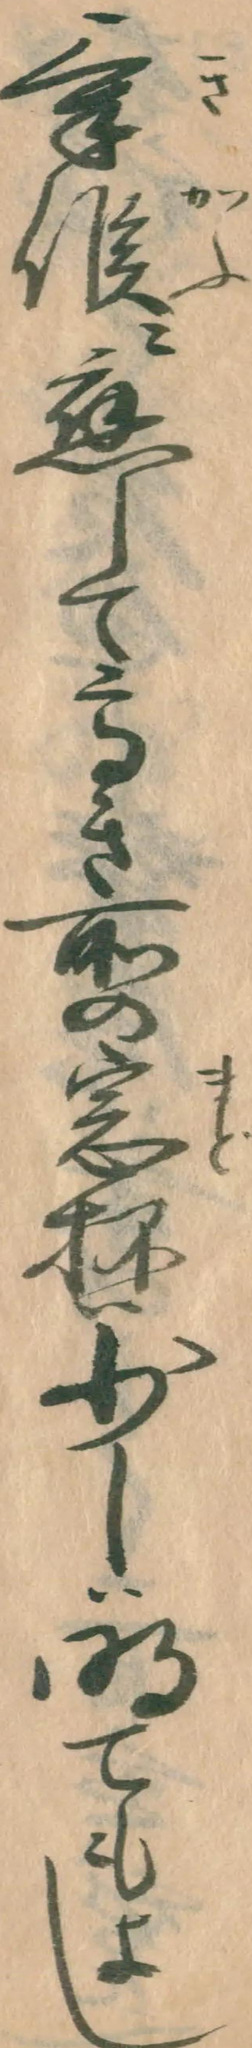気候に応して高き所の窓抔は少しは明てもよし

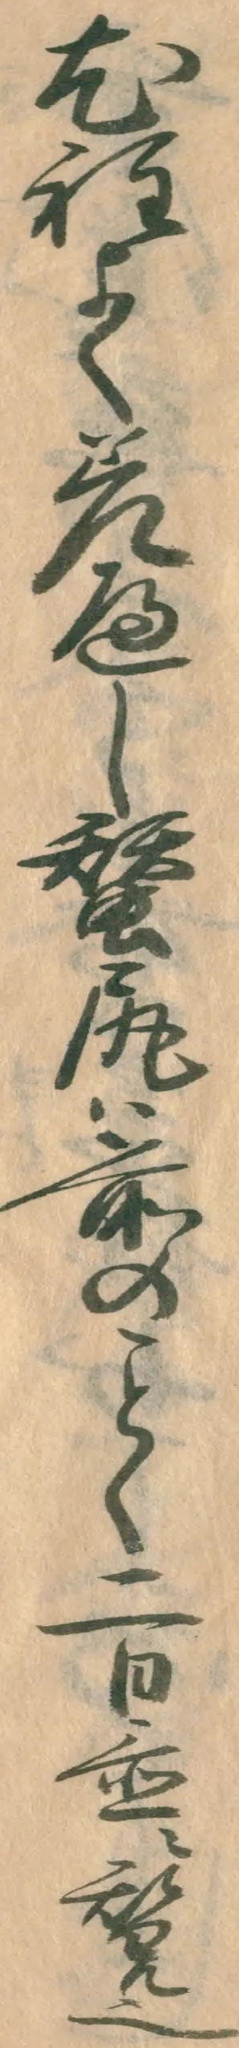尤程よく差へし蚕尻は前のことく二日置に替也
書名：養蚕録
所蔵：国立国会図書館 National Diet Library, JAPAN
